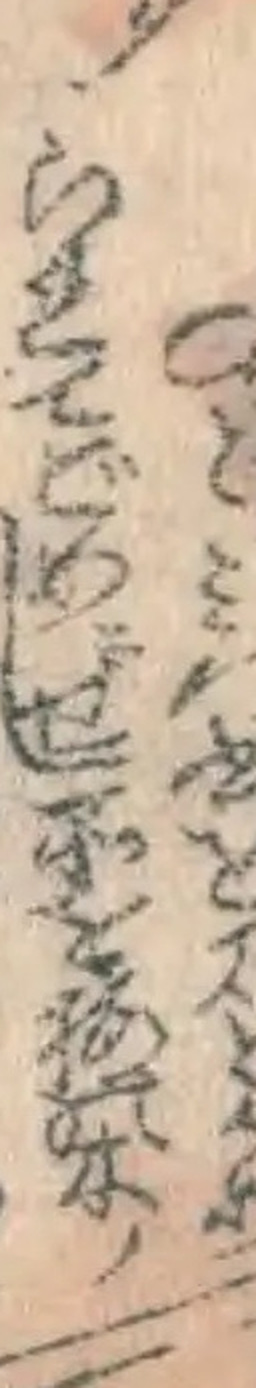られてごめにせし所を梅の木の
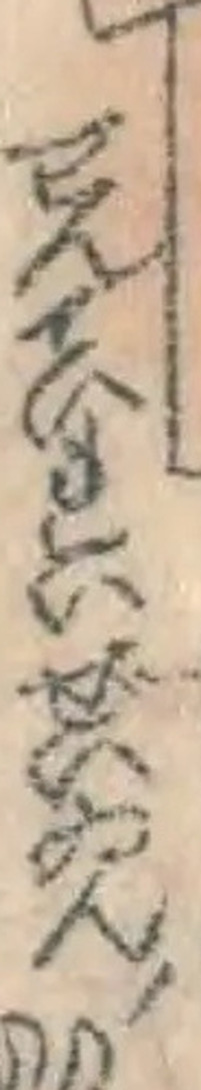せんていれいぜいゐんの
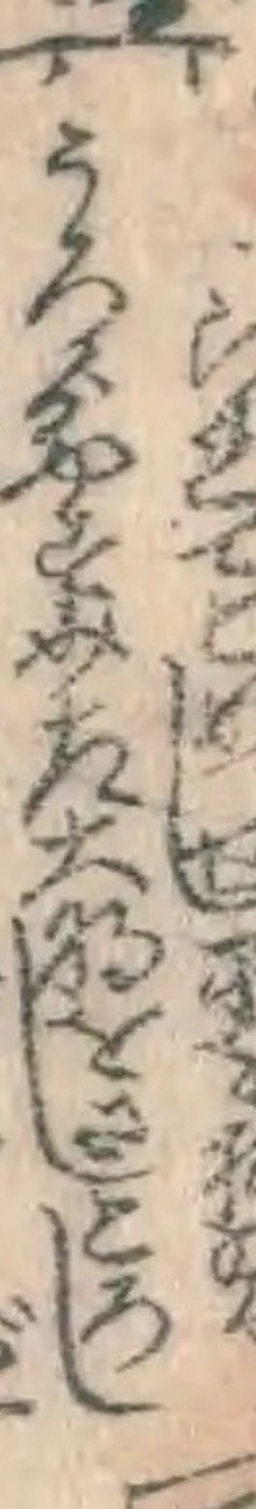うろよりやす介左大将をさしころし
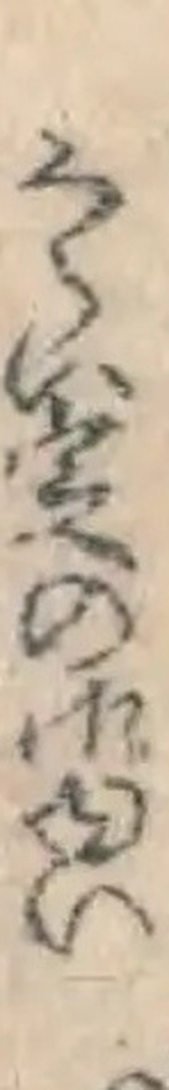くらい定の御ゆい
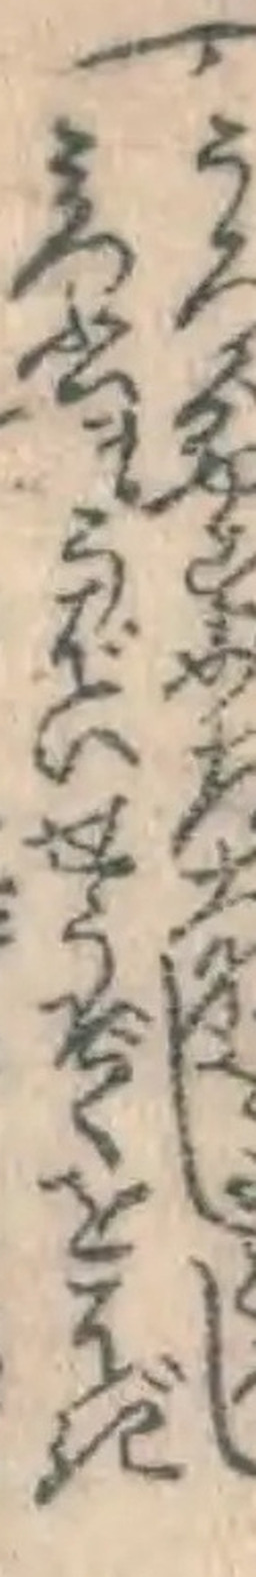みつ書をうばいせうぞくをはぎ
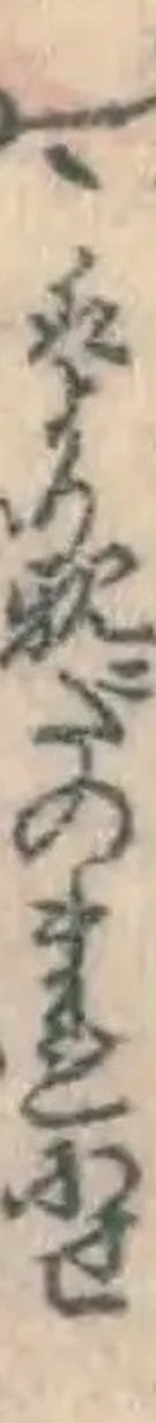取より親にたのまれにせ
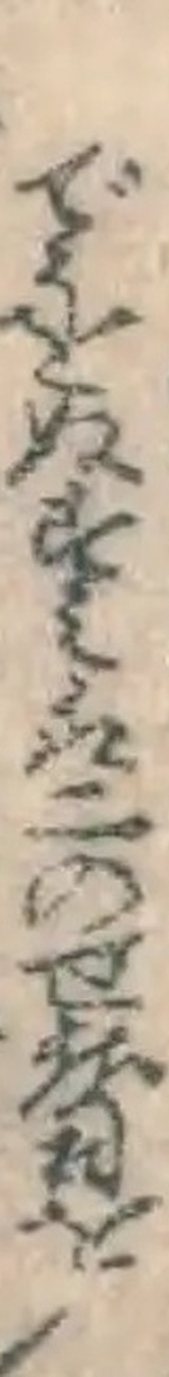でうをぬすみ取二のせ庄司を
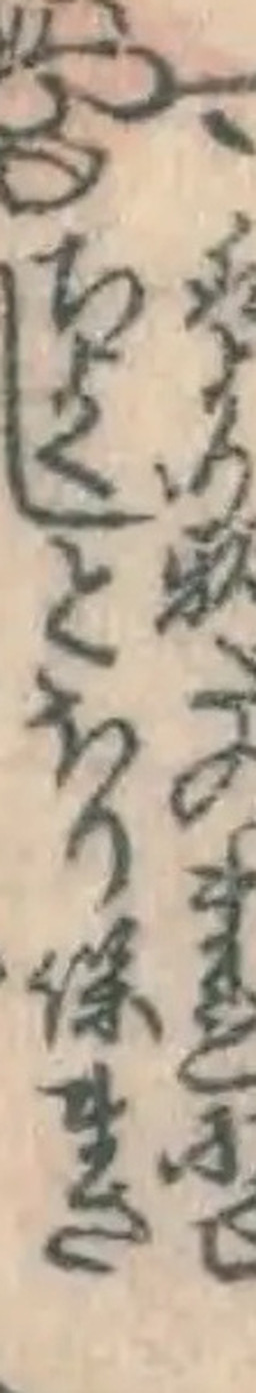ちよくしとほり保まさ
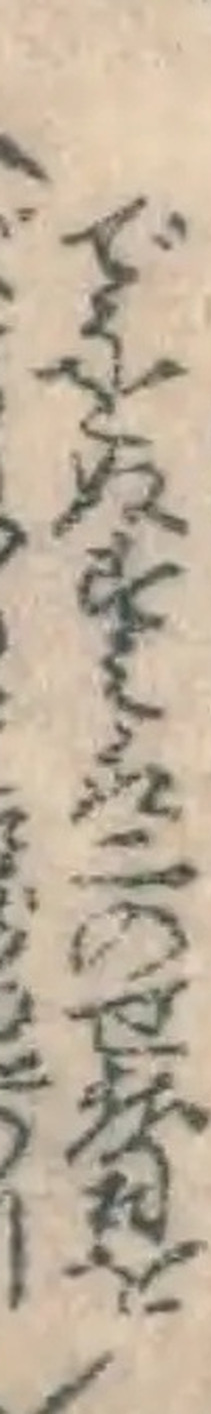でうをぬすみ取二のせ庄司を
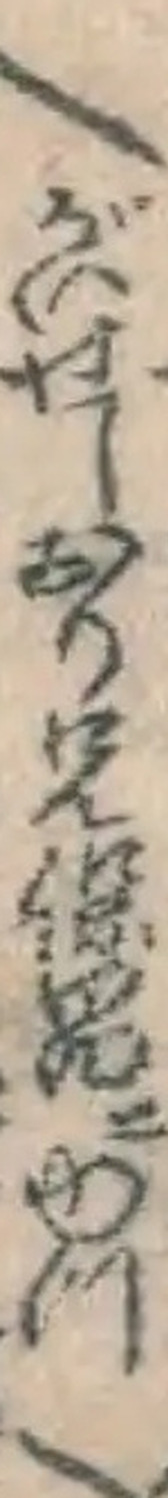がいせしおり兄保昌にゆつ
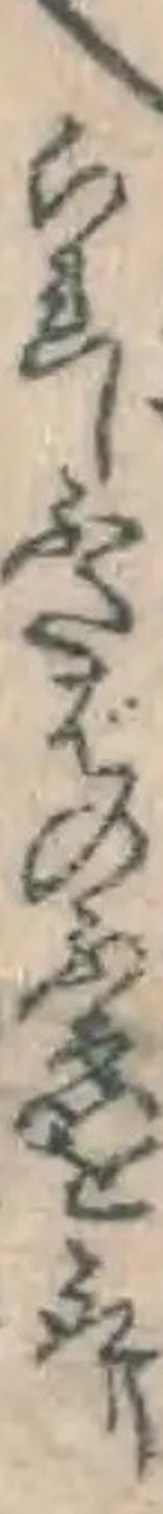られしふたばのふゑを取り
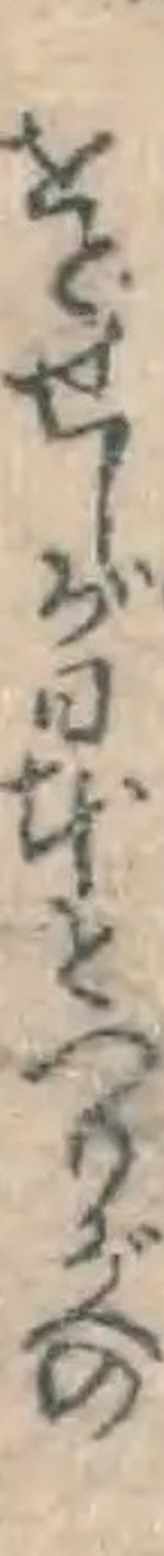をとせしが日本をつりがへの
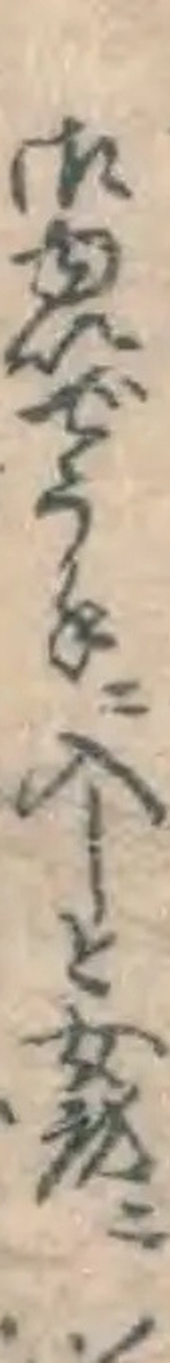御ゆいでう手に入しと女房に
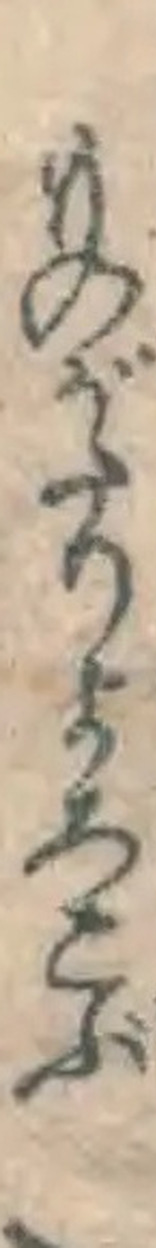ものがたりよろこぶ
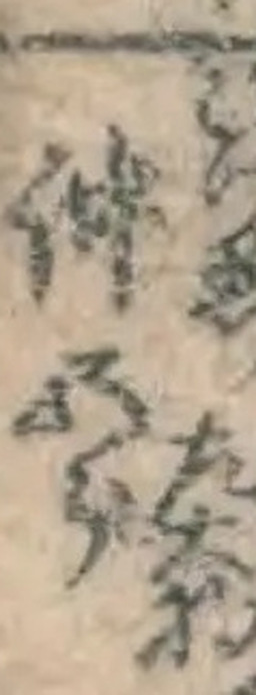伝五郎

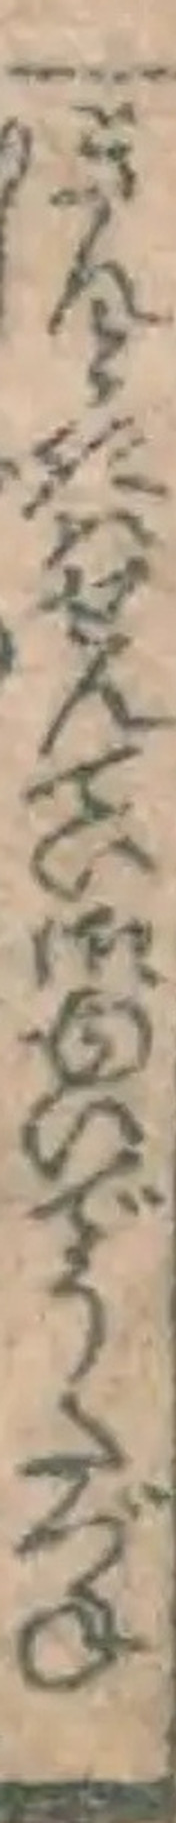きんときはせんてい御ゆいでうたづね
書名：四天王宿直着綿
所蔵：国立国会図書館 National Diet Library, JAPAN
